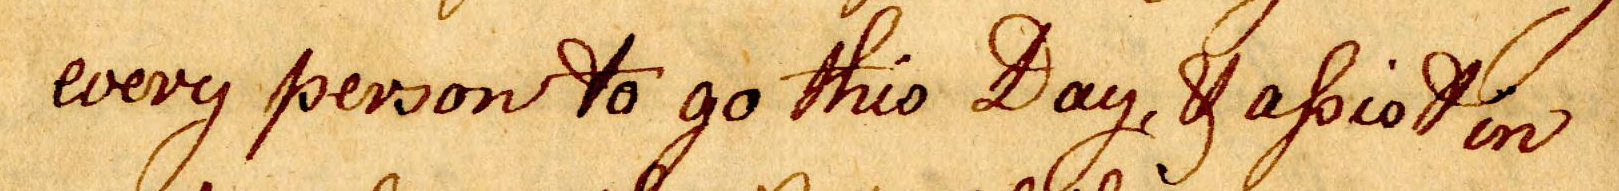ever person to go this Day, & assist in
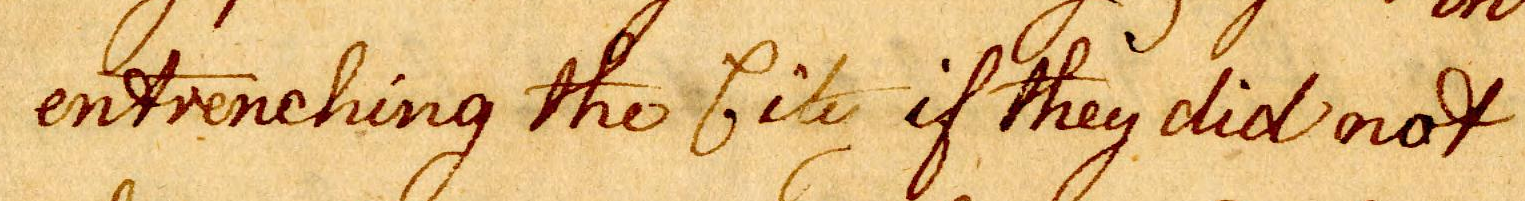entrenching the City if they did not
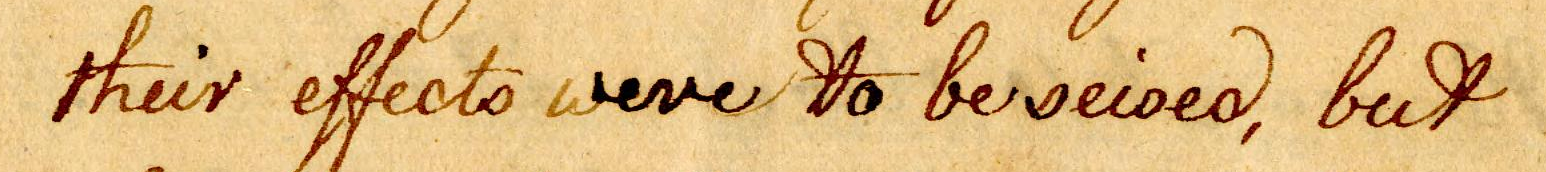their effects were to be seised, but
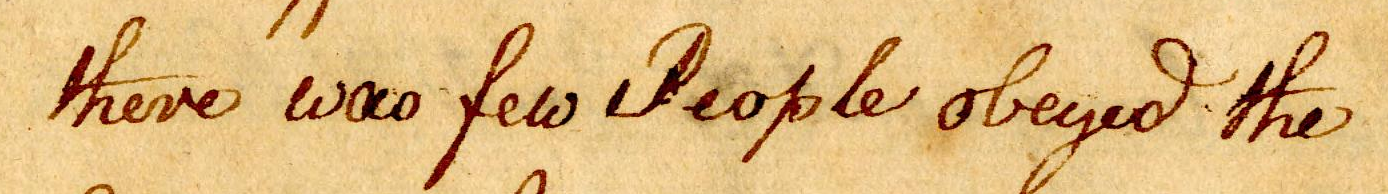there was few People obeyed the
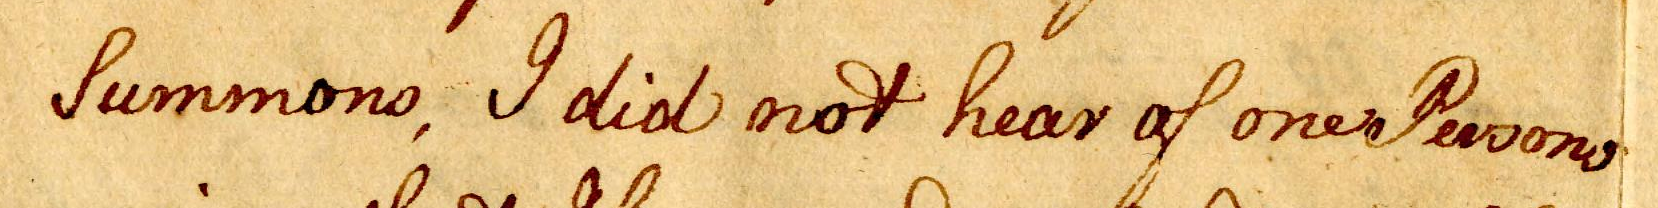Summons, I did not hear of one Persons
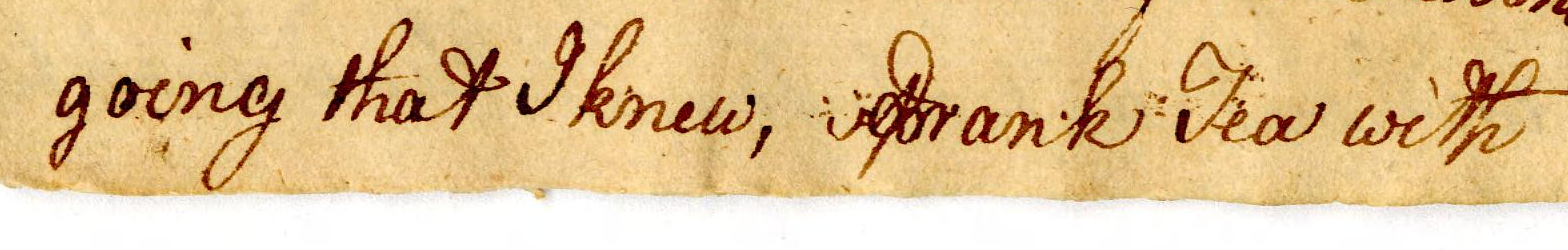going that I knew, drank Tea with
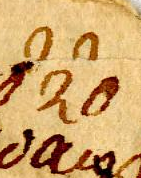20
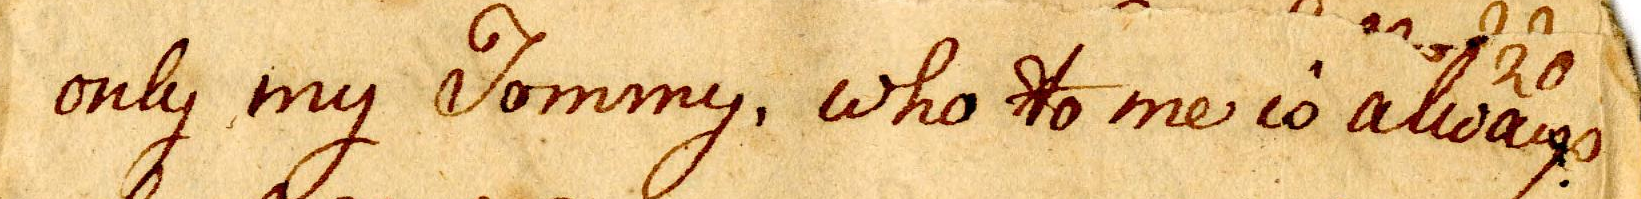only my Tommy, who to me is always
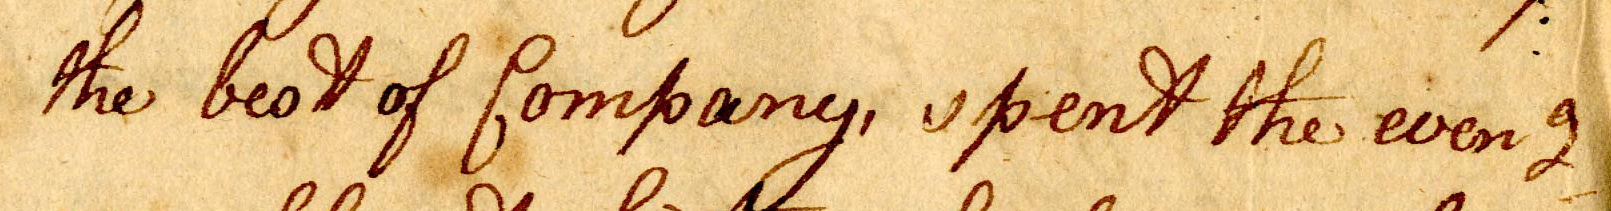the best of Company, spent the even^g
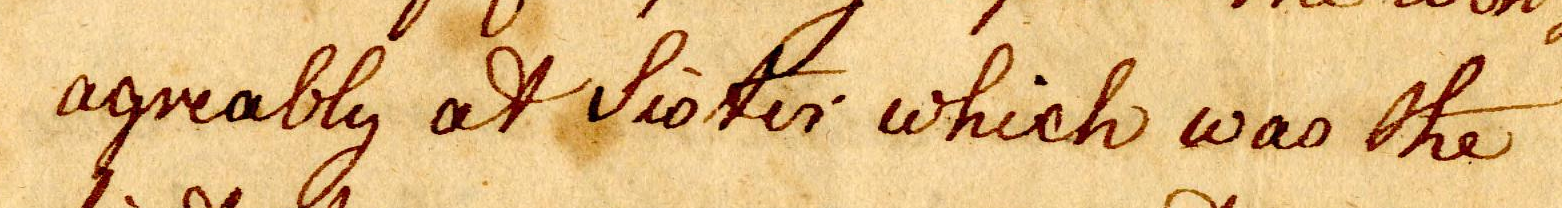agreably at Sister which was the
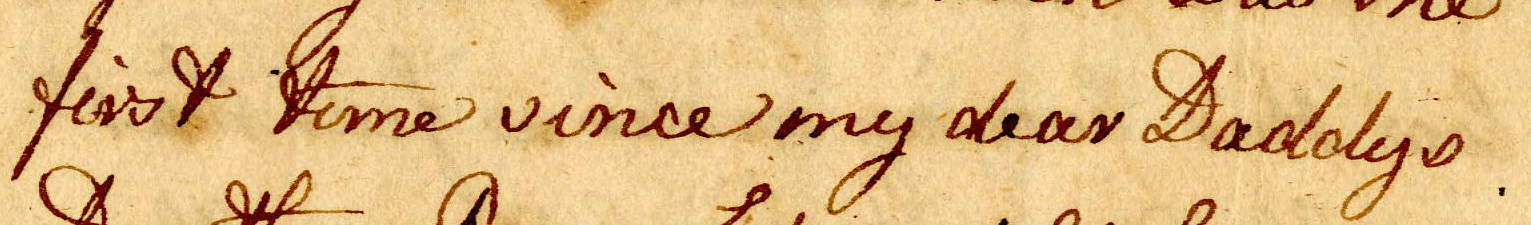first time since my dear Daddys
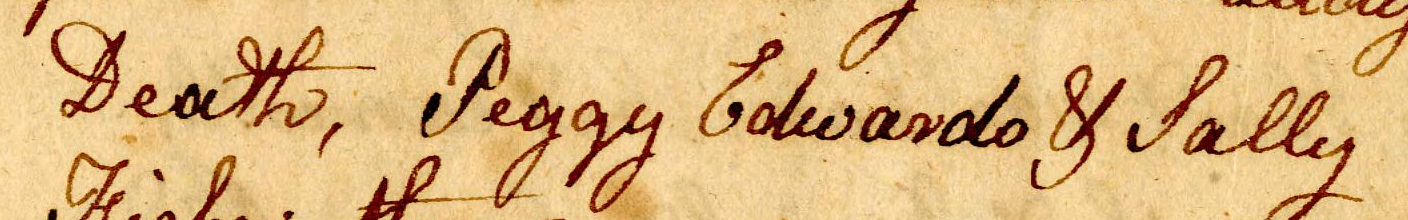Death, Peggy Edwards & Sally
